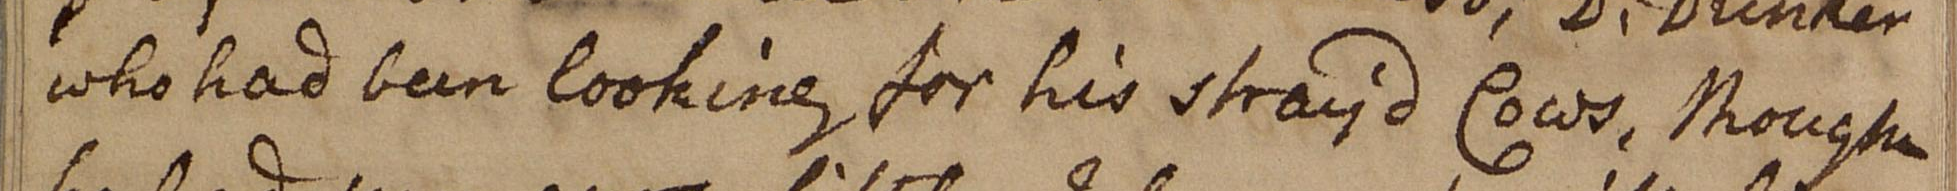who had been looking for his stray'd Cows, though
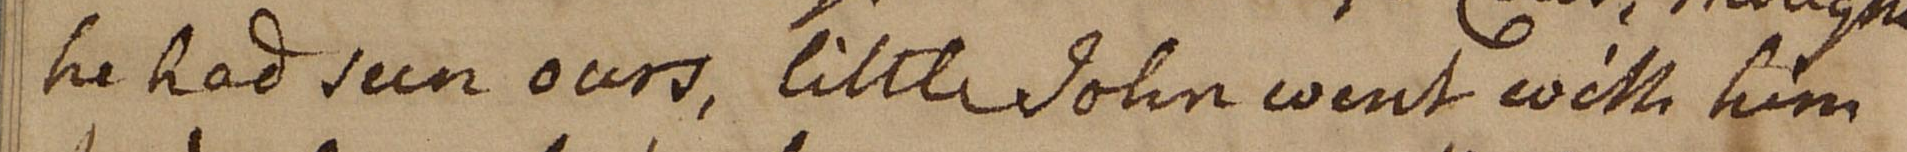he had seen ours, little John went with him
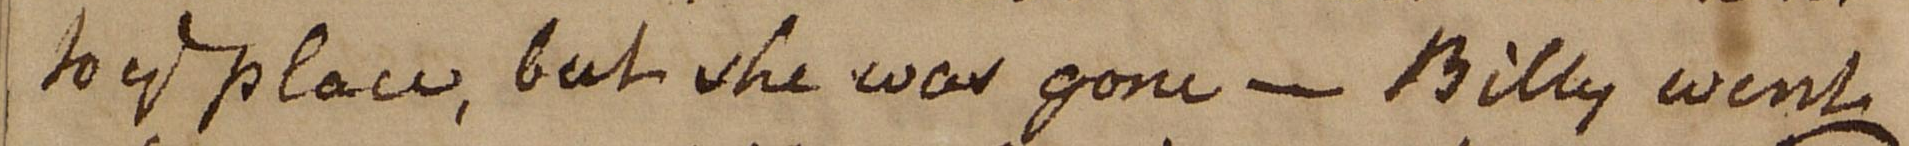to y^e place, but she was gone- Billy went
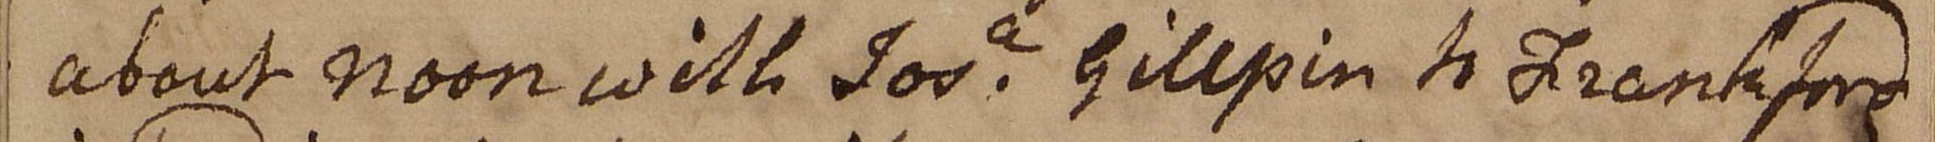about noon with Jos^a. Gillpin to Frankford
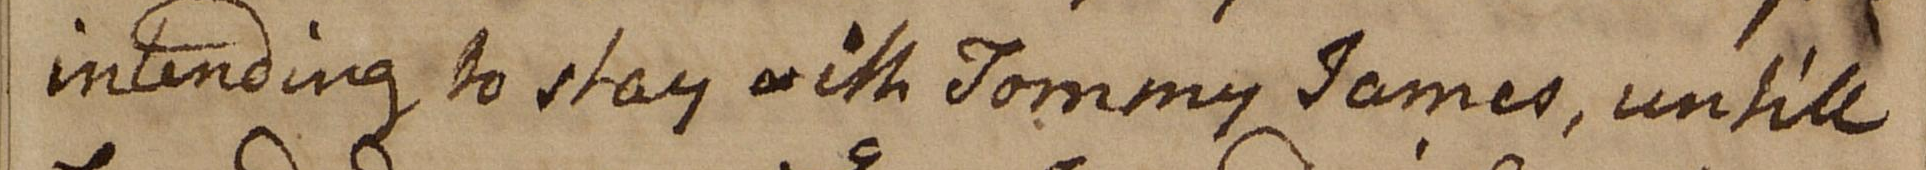intending to stay with Tommy James, untill
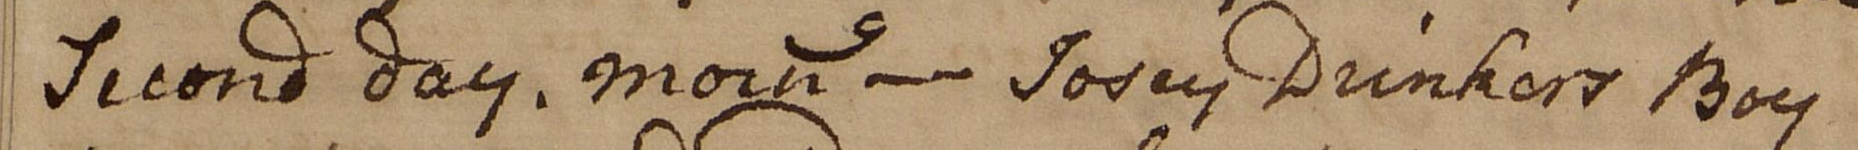Second day, morn^g- Josey Drinkers Boy
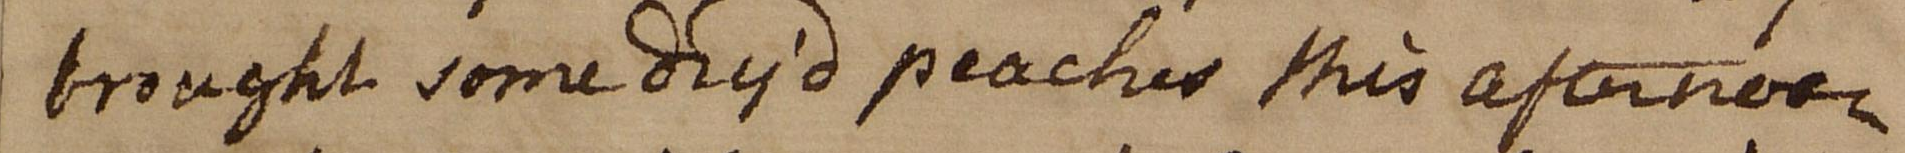brought some dryd peaches this afternoon
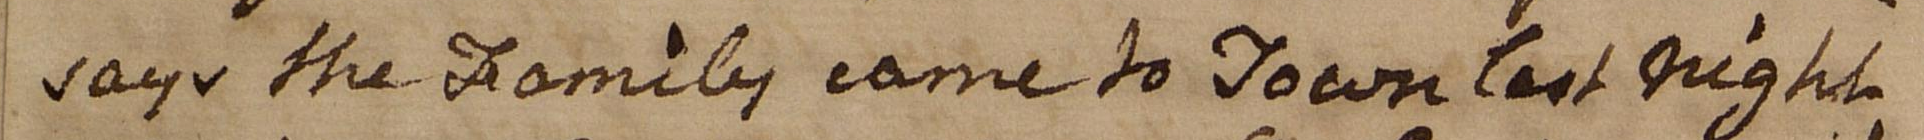says the Family came to Town last night,
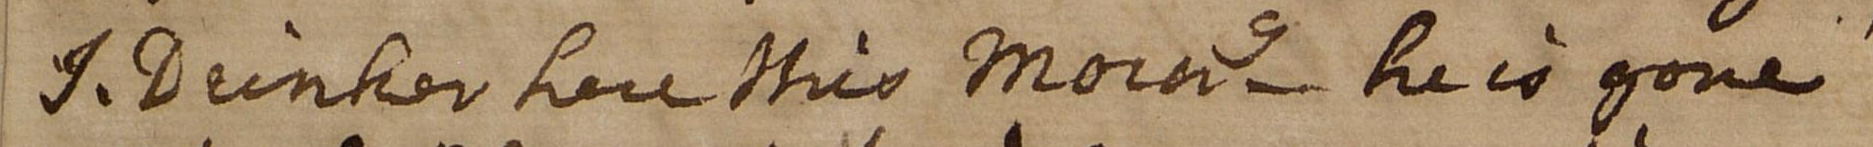I. Drinker here this morn^g- he is gone
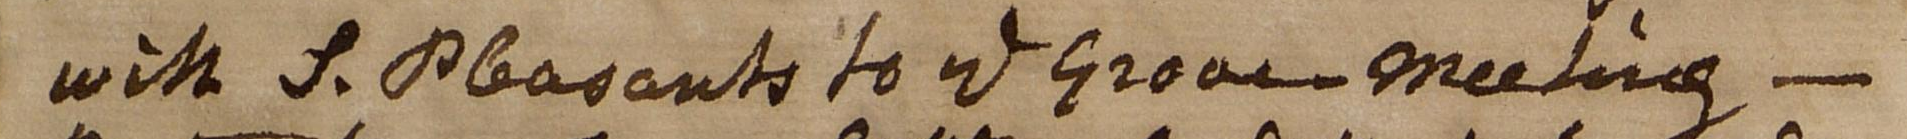with S. Pleasants to y^e Grove- meeting-
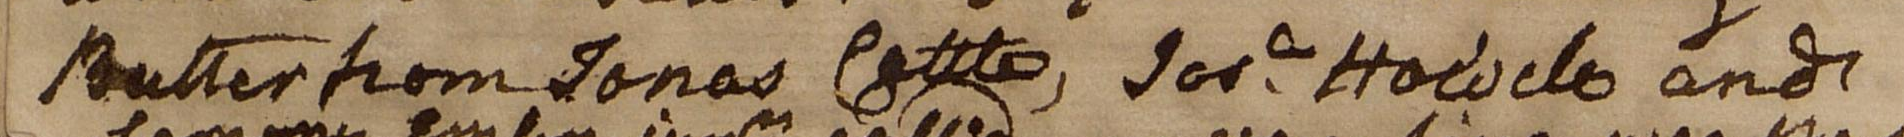Butter from Jonas Cattle, Jos^a. Howels and
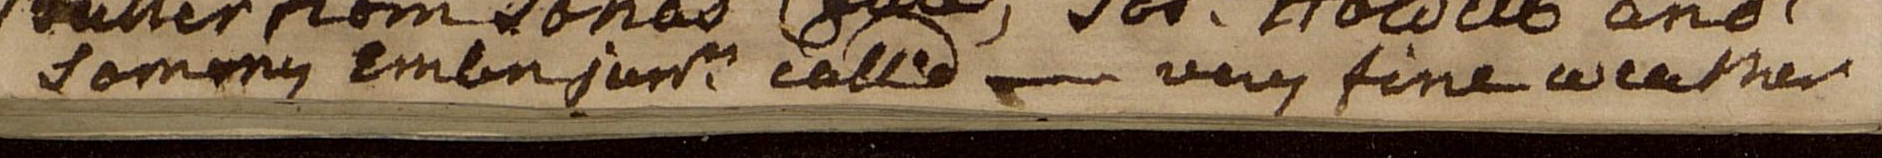Sammy Emlen jun^r. call'd- vey fine weather
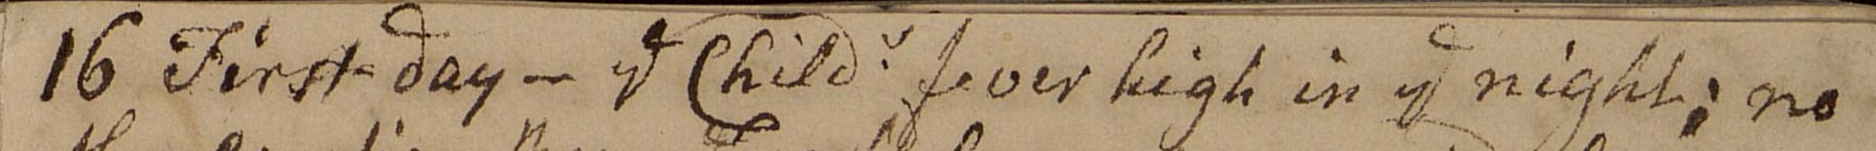16 First day- y^e Child^s. fever high in y^e night; no
